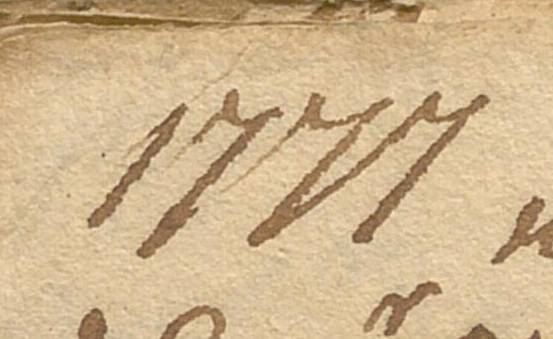1777
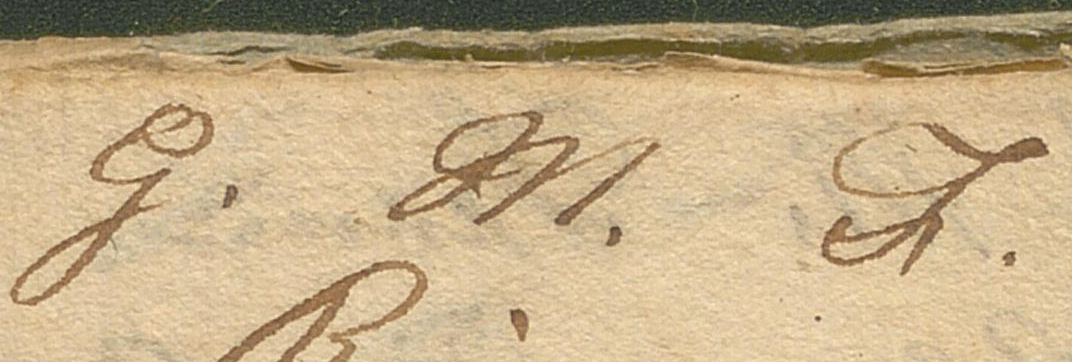G. M. F.
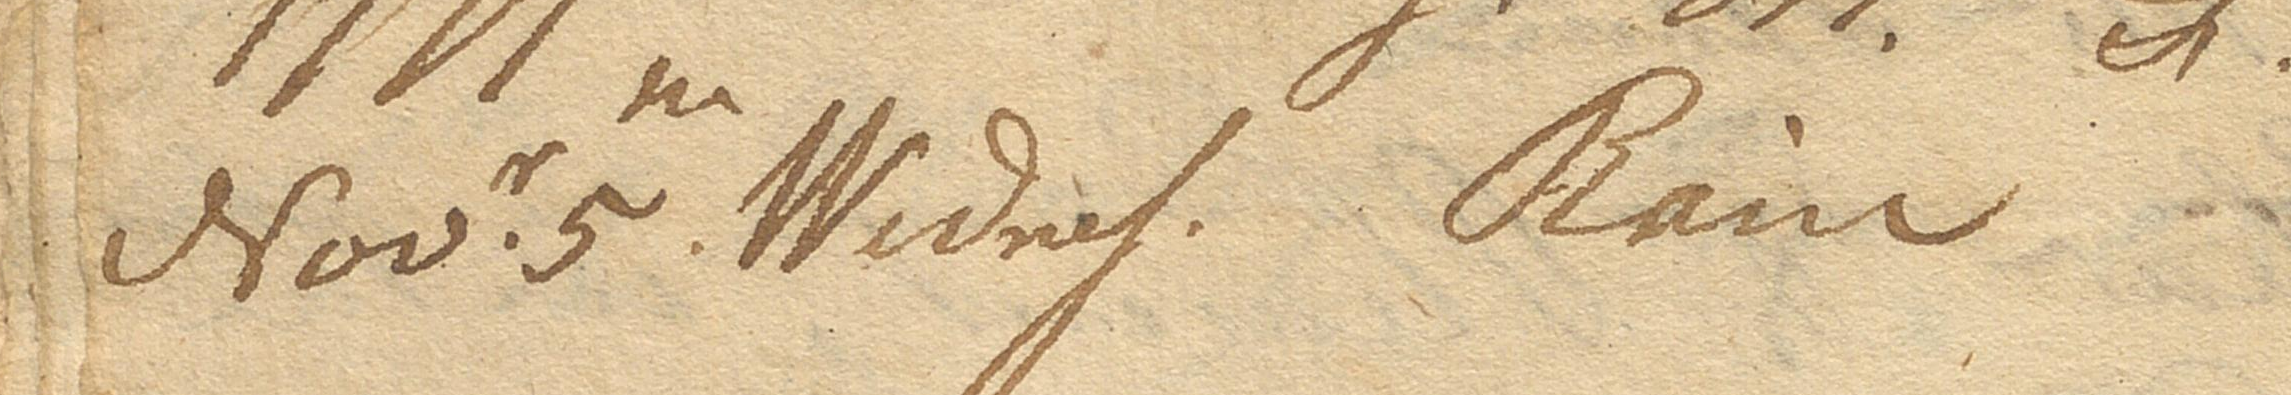Nov^r. 5^th Wednes. Rain
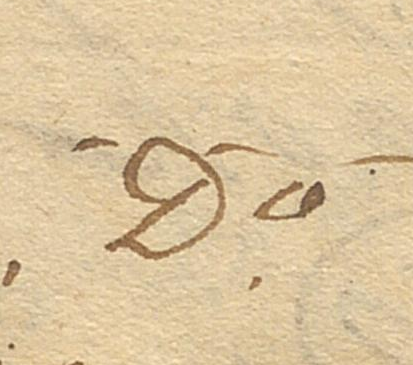D^o
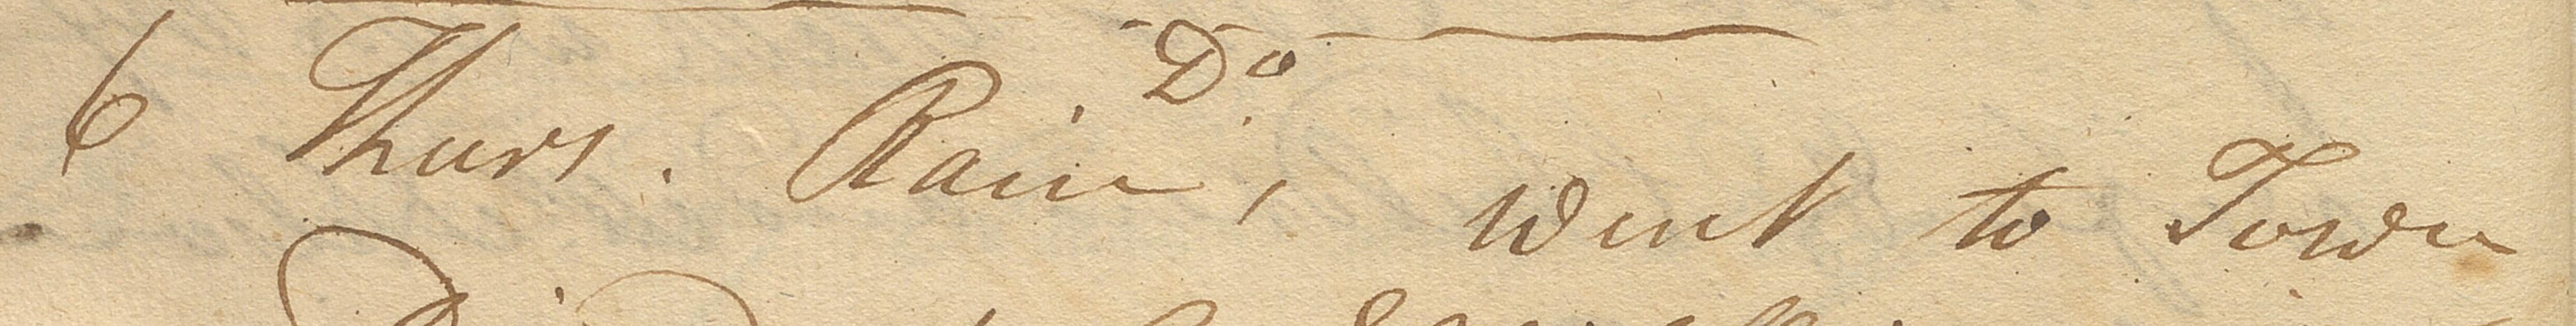6 Thurs. Rain, went to Town
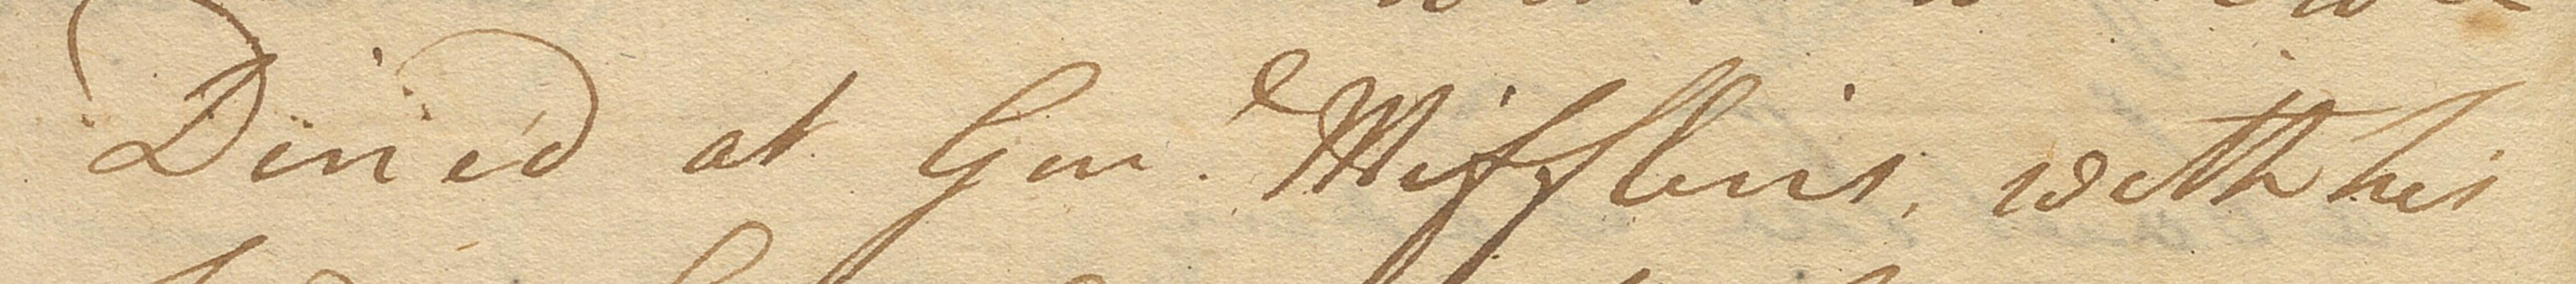Dined at Gen^l. Mifflins, with his
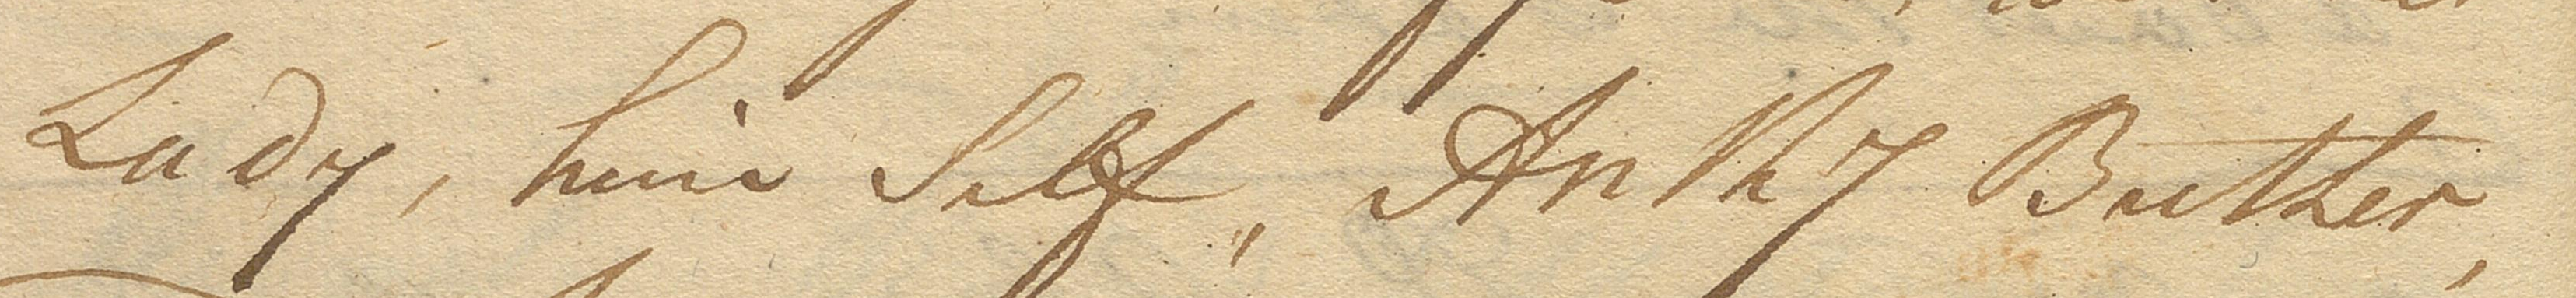Lady, him self Anth^y Butler
